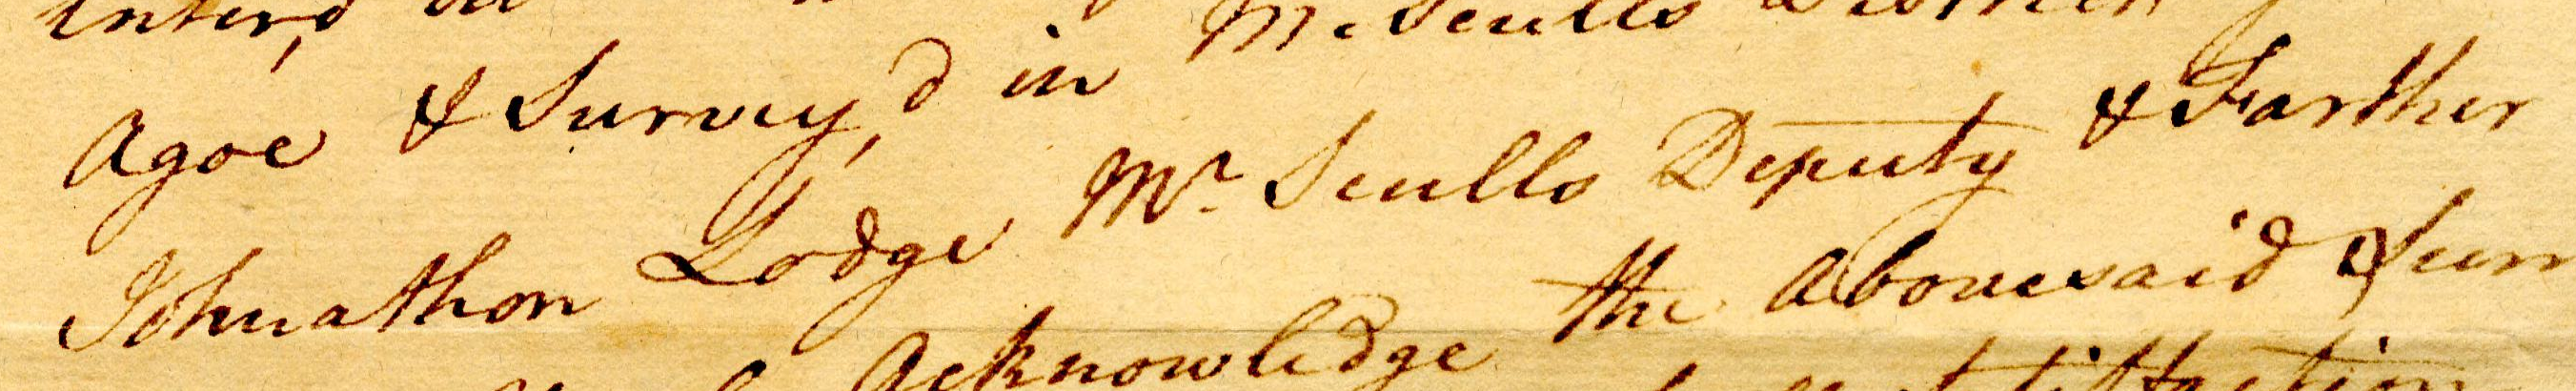Johnathan Lodge M^r. Sculls Deputy & Farther
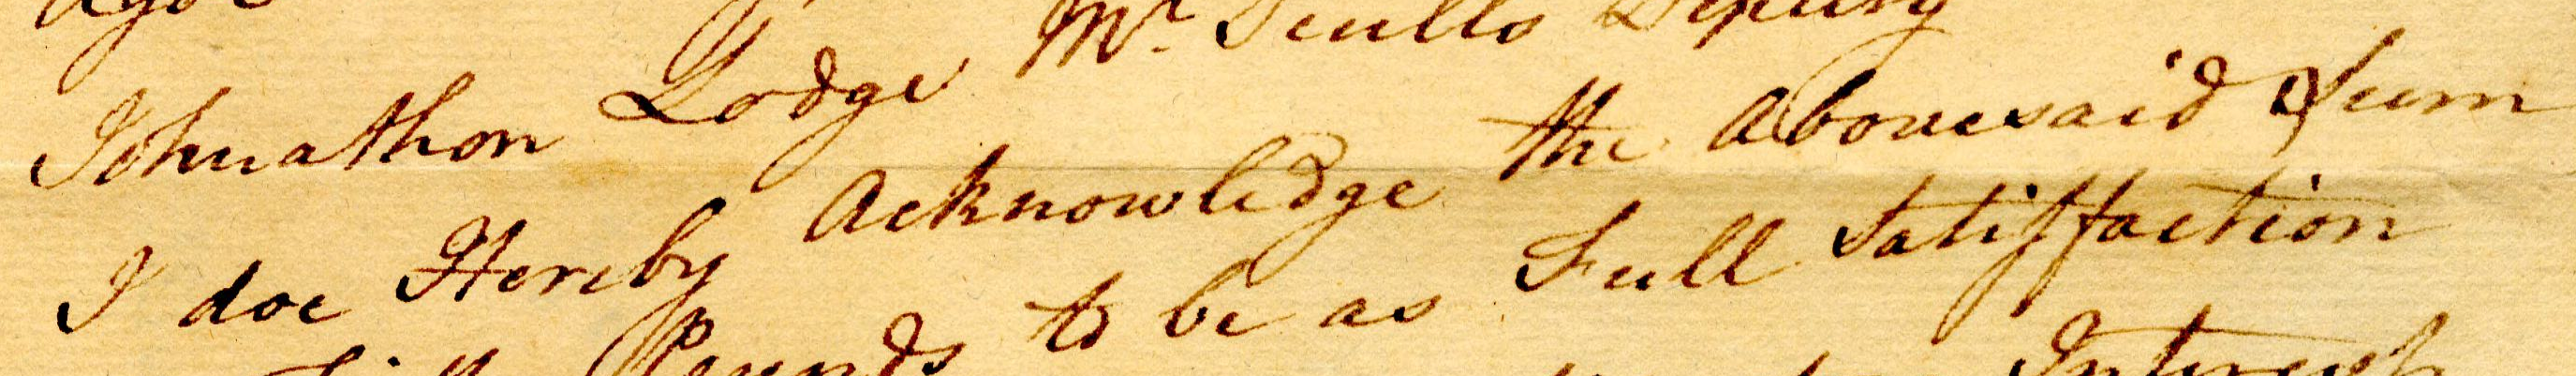I doe Hereby Acknowledge the Above said Sum
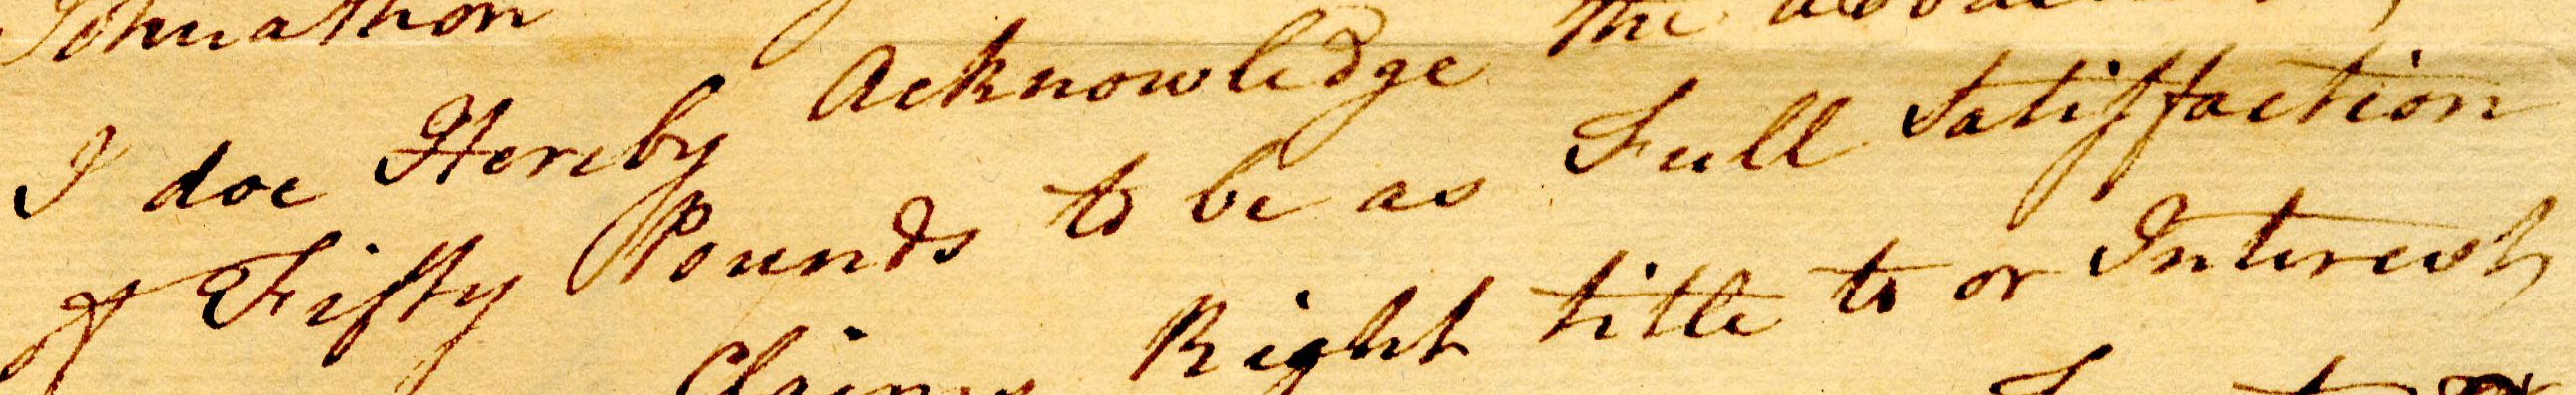of Fifty Pounds to be as Full satisfction
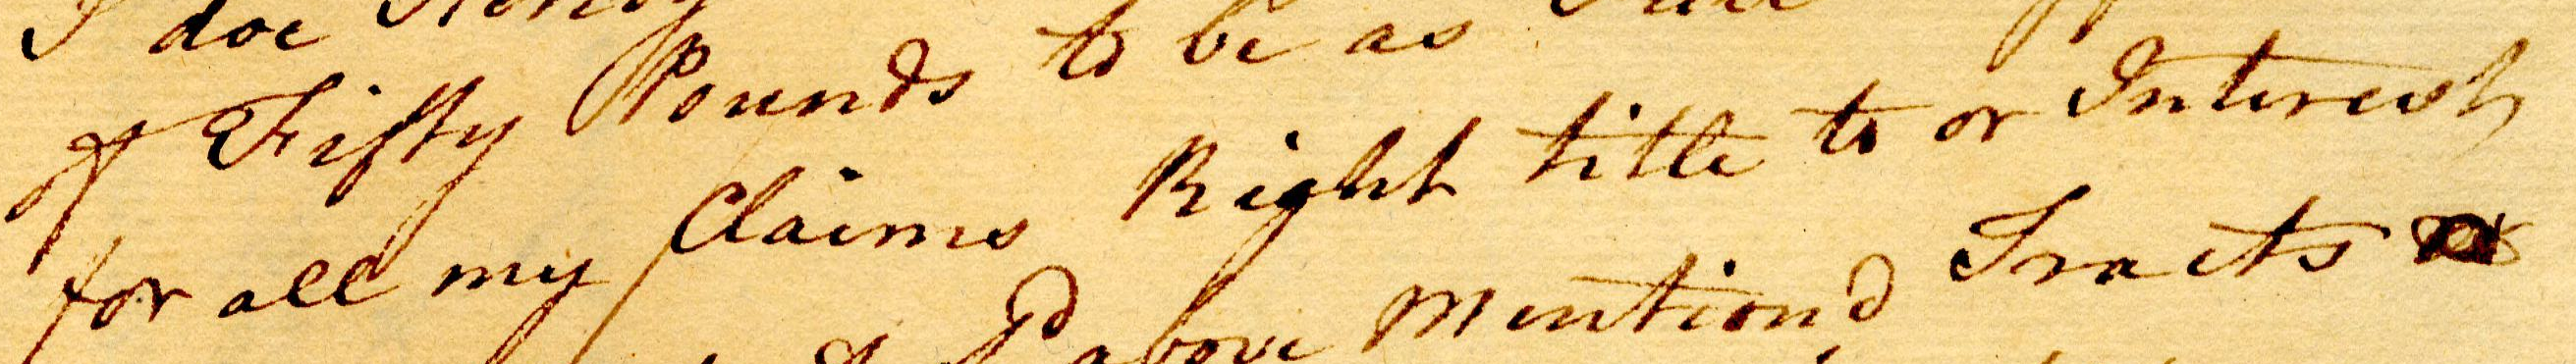for all my Claims Right title to or Interest
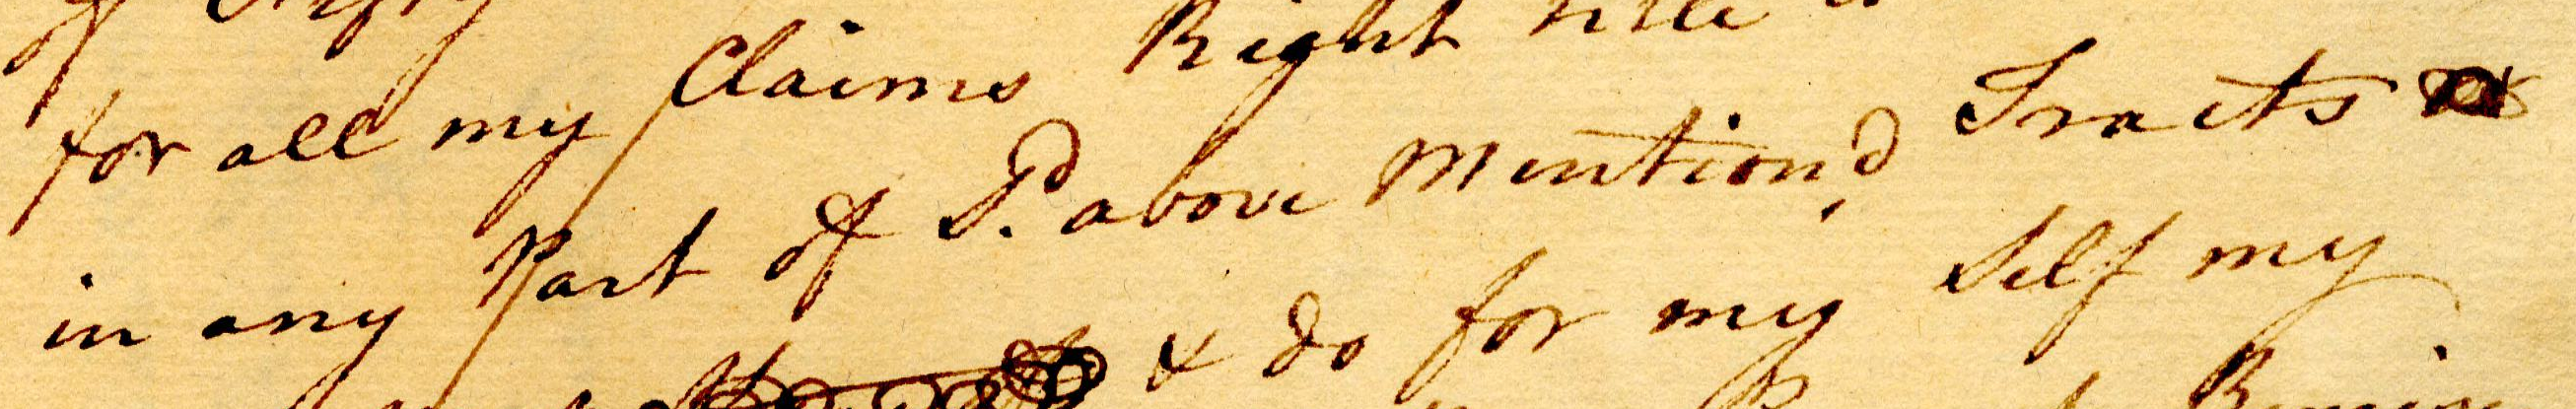in any part of s^d. above mention'd Tracts [__]
